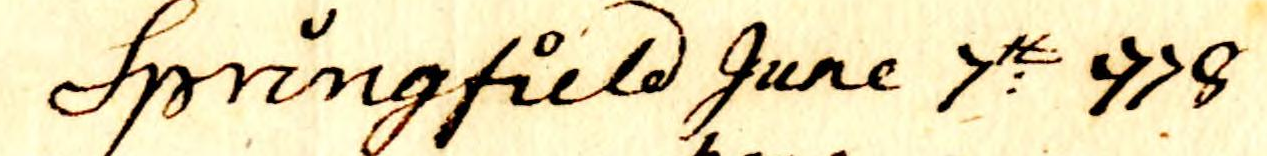Springfield June 7^th: 1778
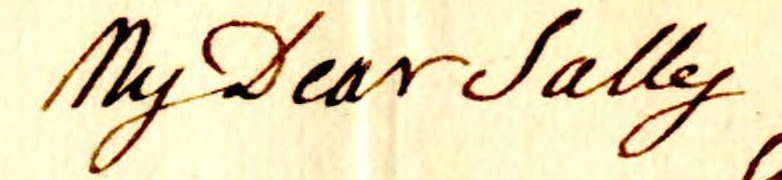My Dear Sally
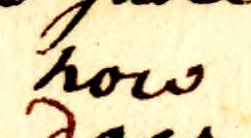how
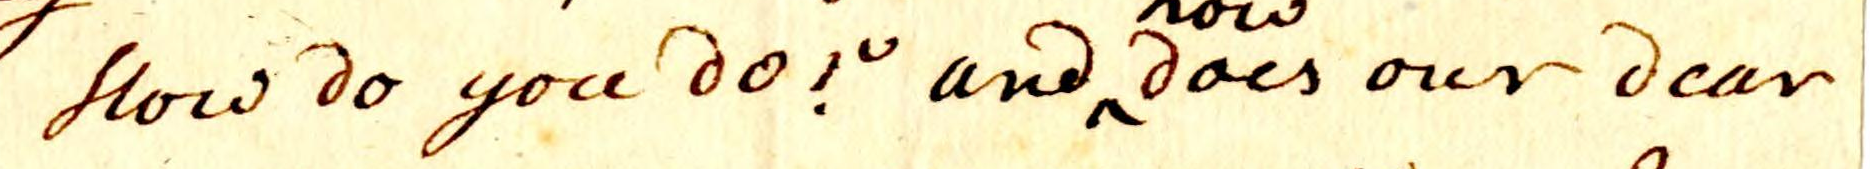How do you do? and ^ does our dear
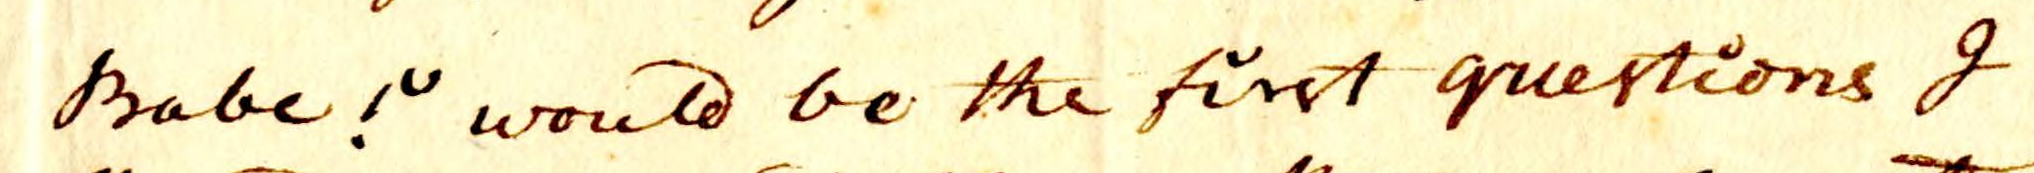Babe? would be the first questions I
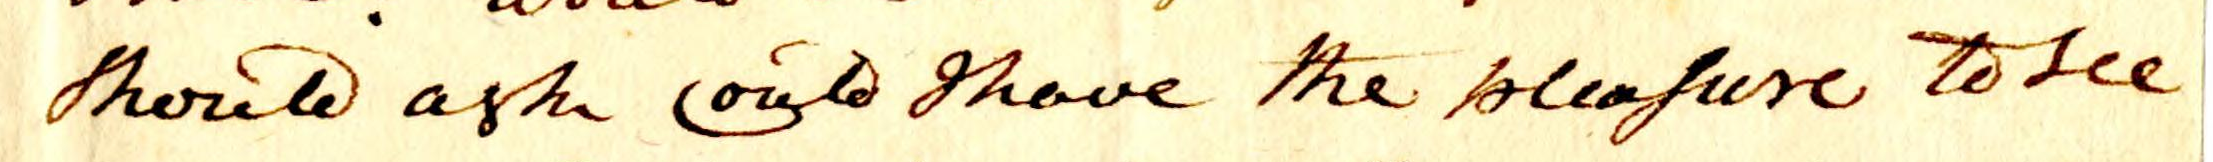Should ask could I have the pleasure to see
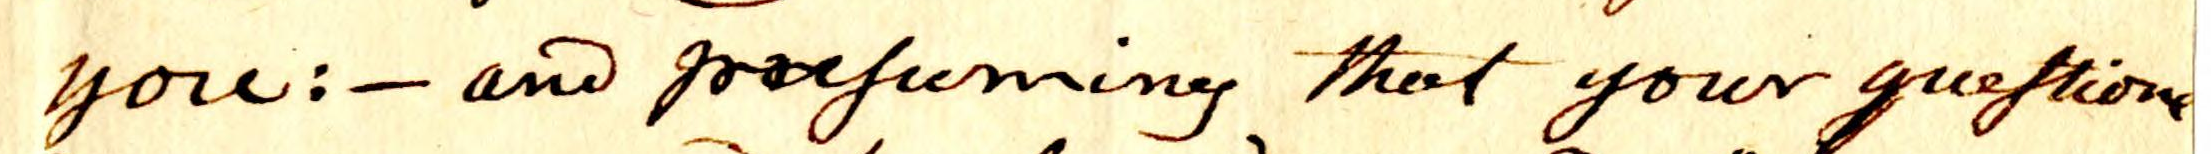you:- and presuming that your questions
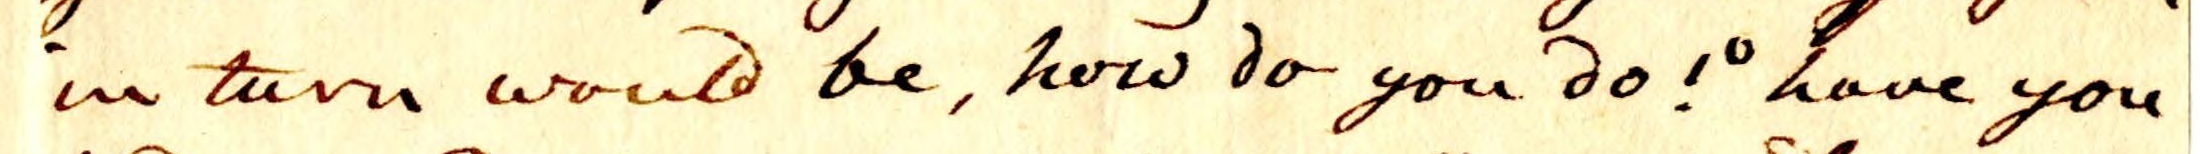in turn would be, how do you do? have you
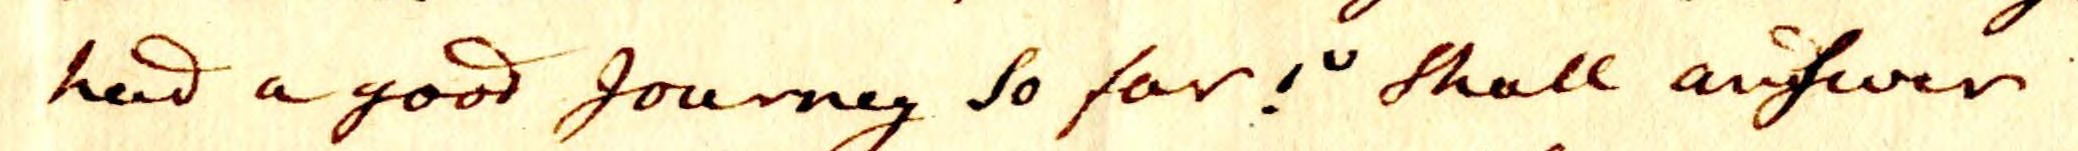had a good Journey so far? shall answer
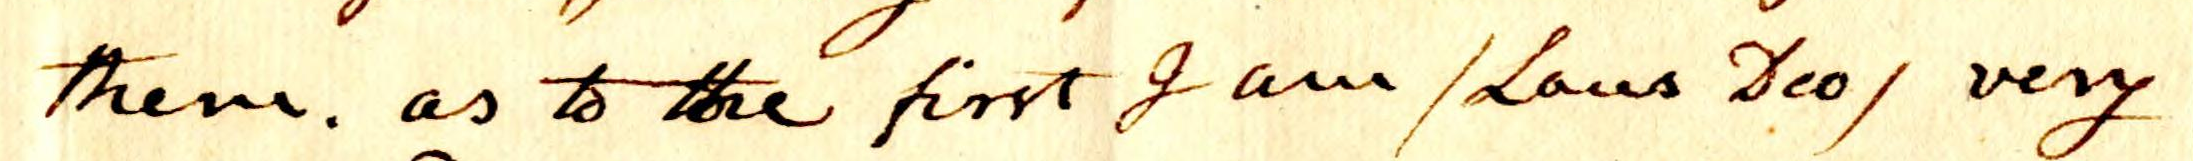them. as to the first I am /Laus Deo/ very
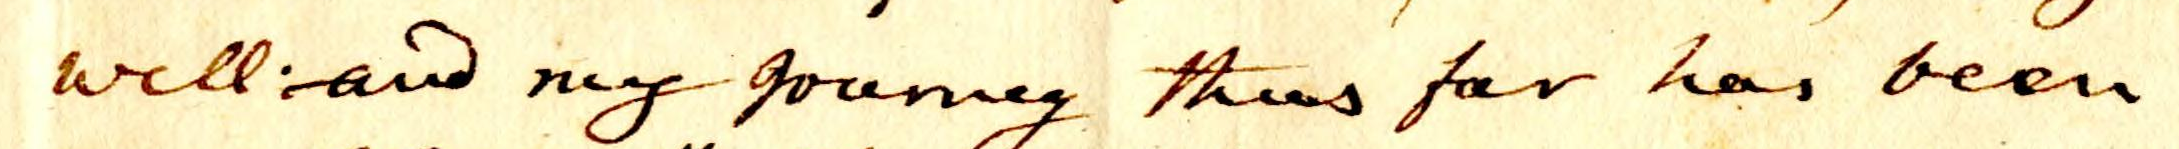well: and my Journey thus far has been
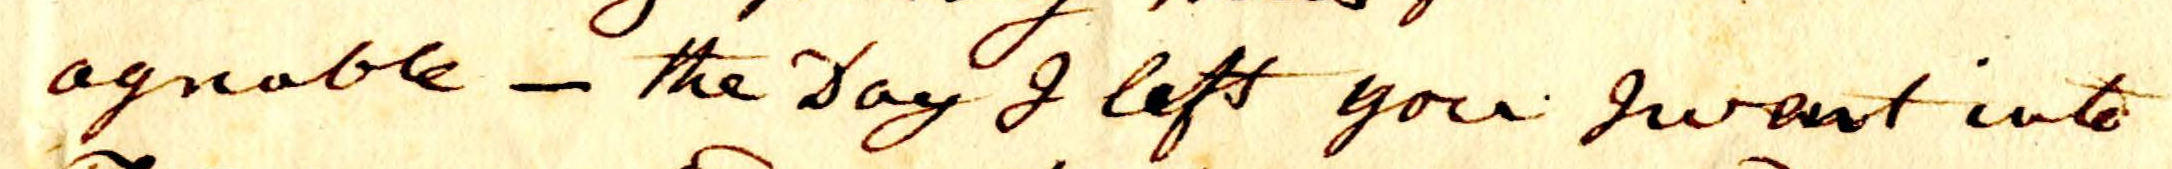agreable- the Day I left you I went into
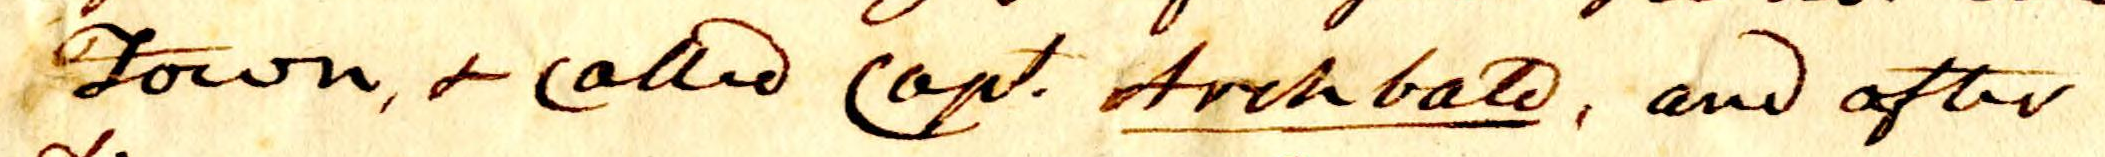Town, & called Cap^t. Archbald, and after
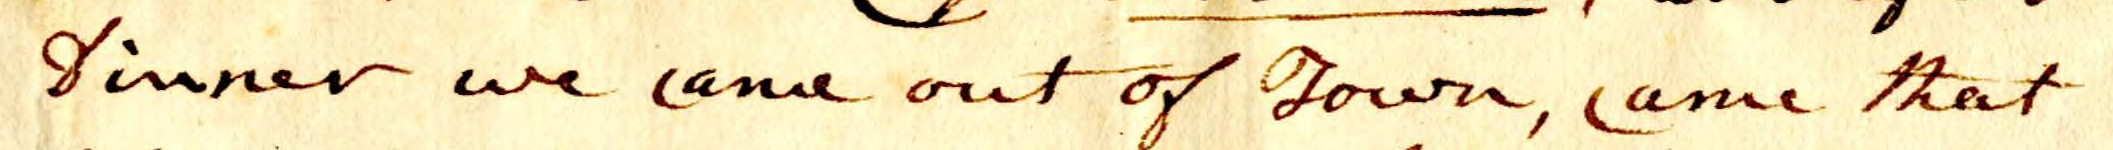dinner we came out of Town, came that
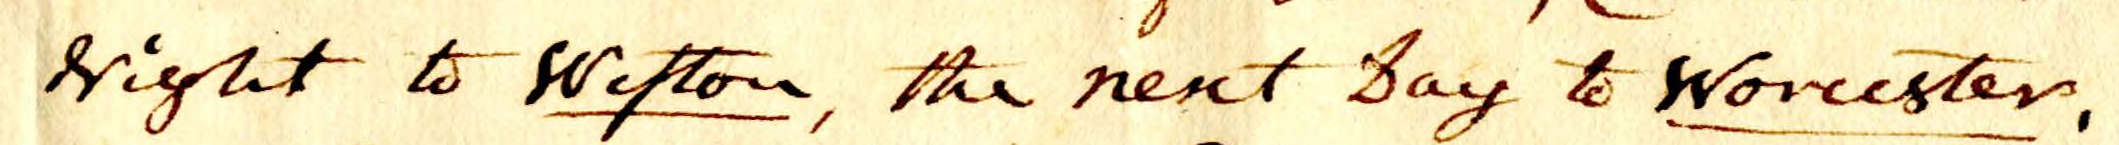Night to Weston the next Day to Worcester,
